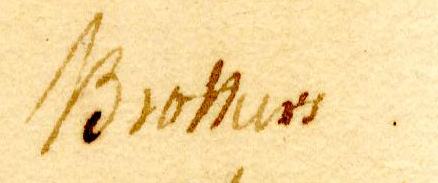Brothers.
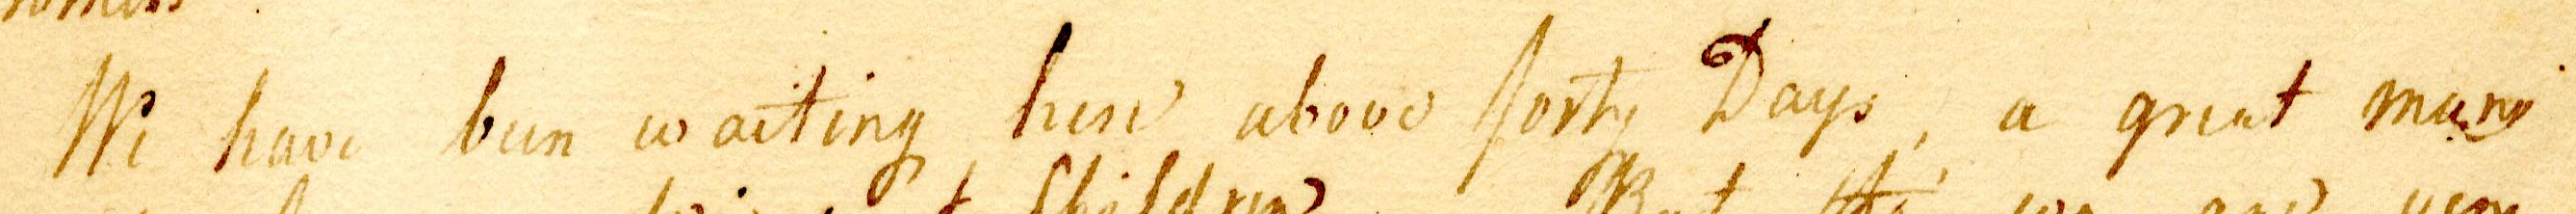We have been waiting here above forty Days, a great many
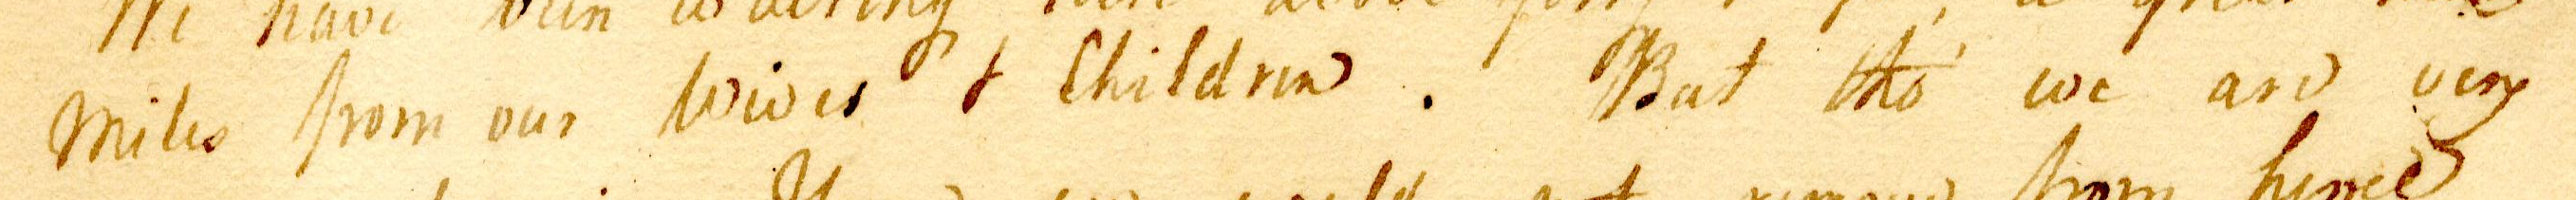miles from our Wives & Children. But tho' we are very
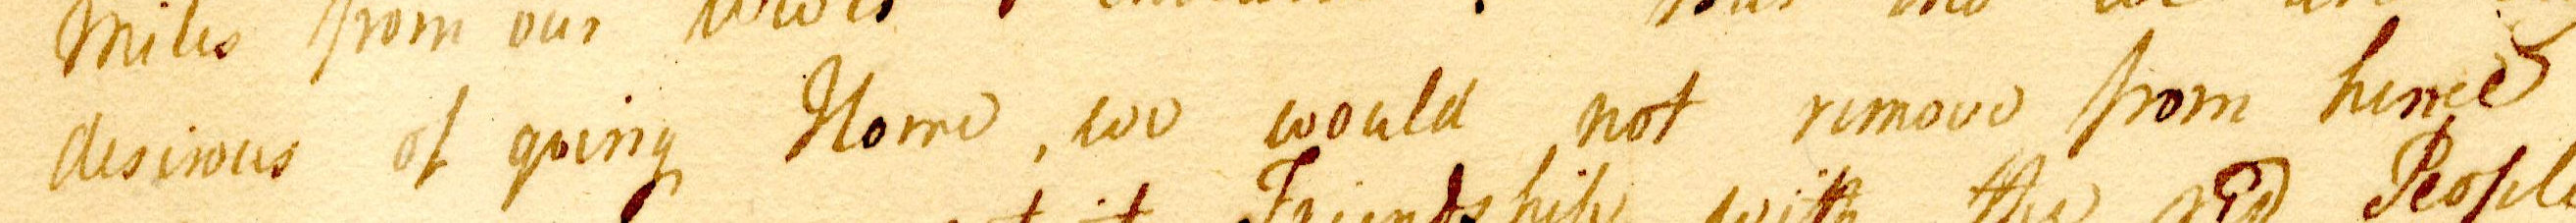desirous of going Home, we would not remove from hence
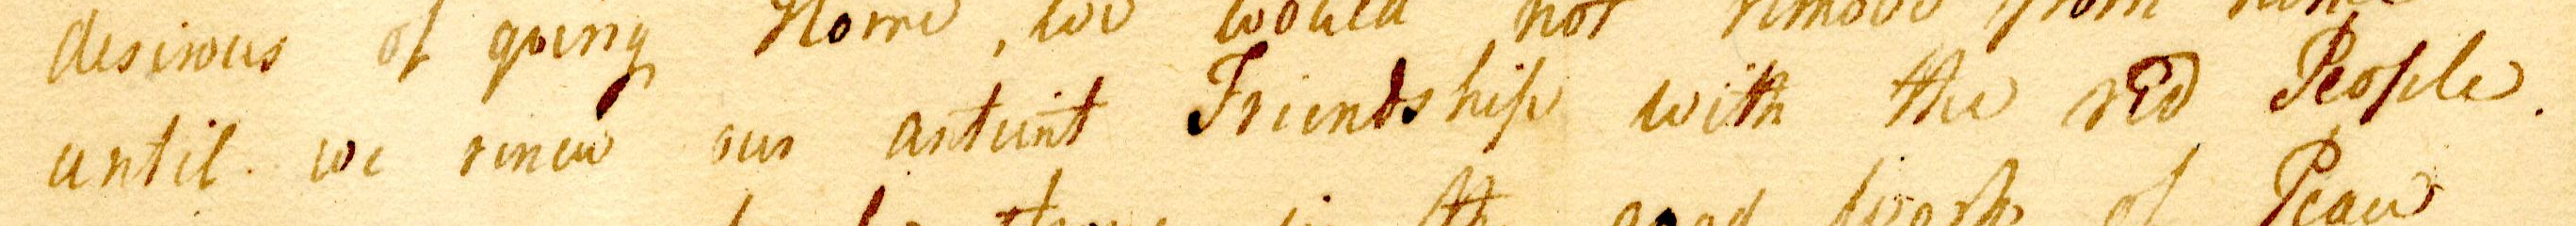until we renew our antient Friendship with the red People.
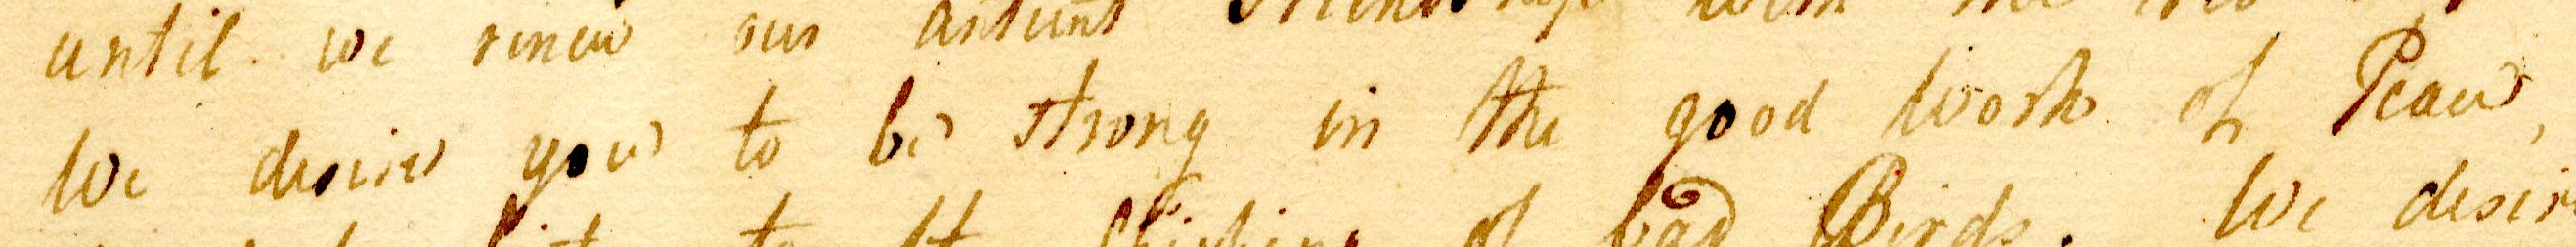We desire you to be strong in the good work of Peace,
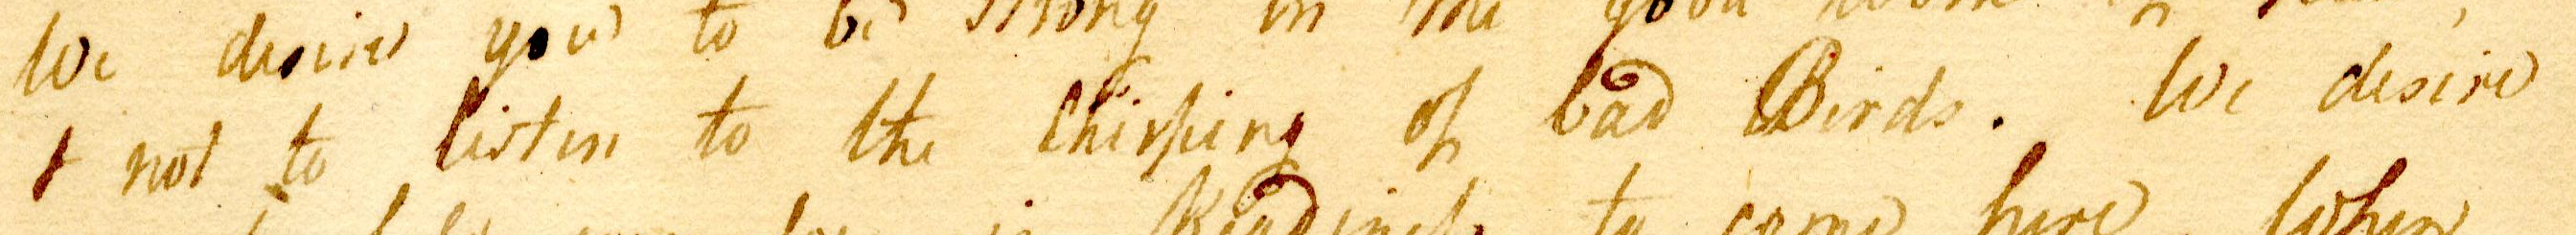& not to listen to the chirping of bad Birds. We desire
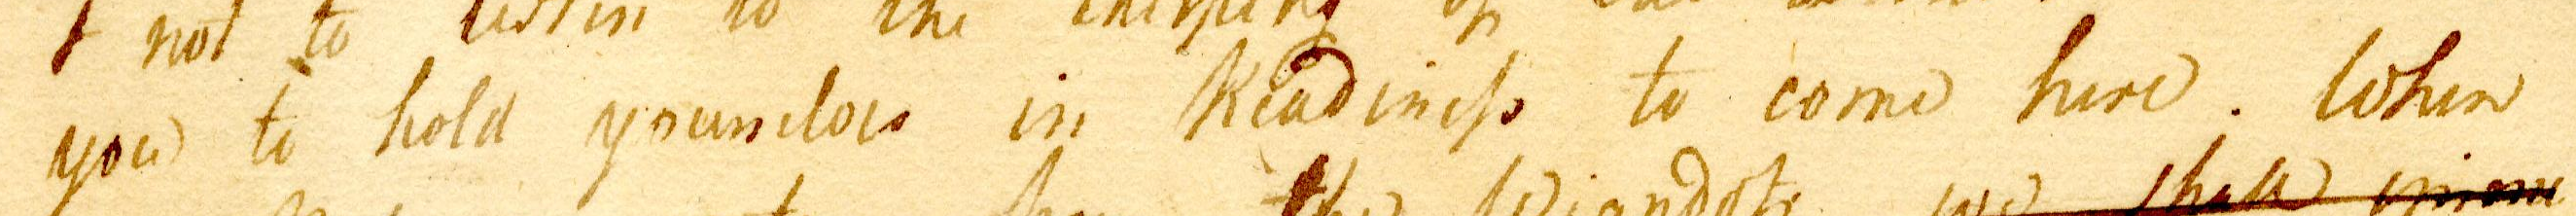you to hold yourselves in Readiness to come here. When
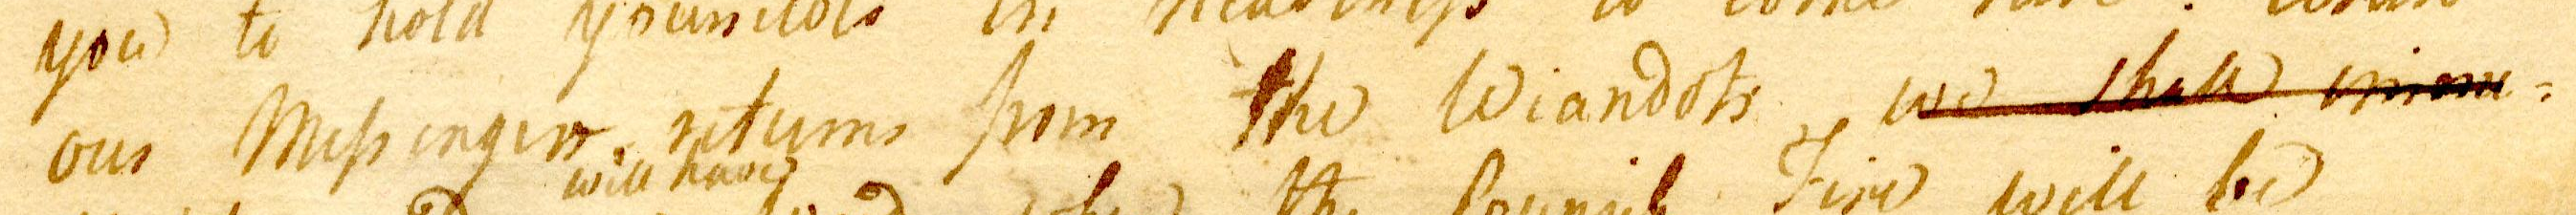our Messenger returns from the Wiandots [we shall imme]
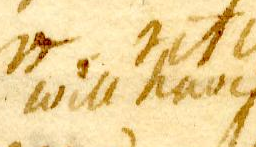will have
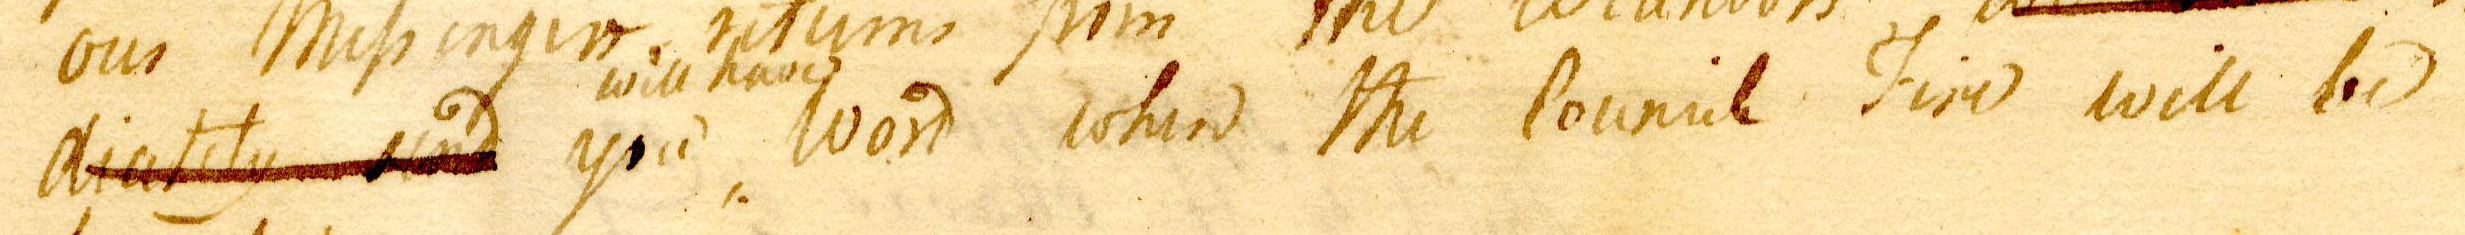[diately send] you ^ word when the Council Fire will be
